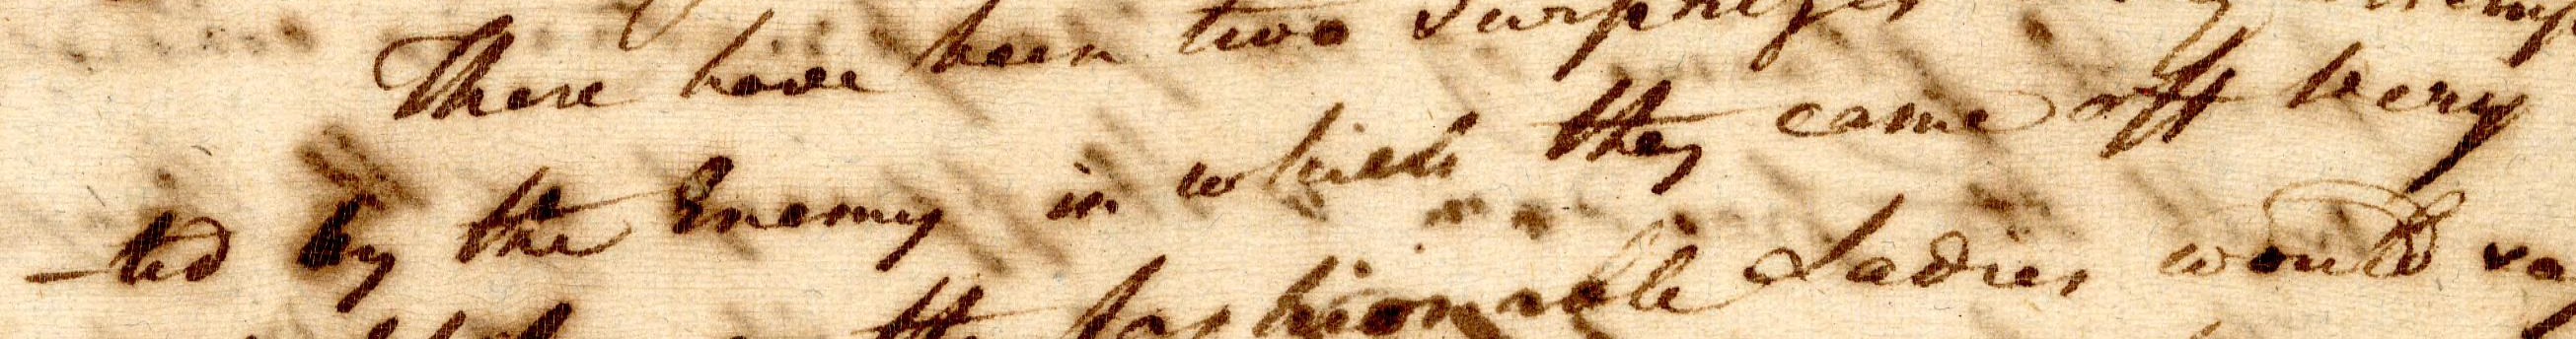-ted by the Enemy in which they came off very
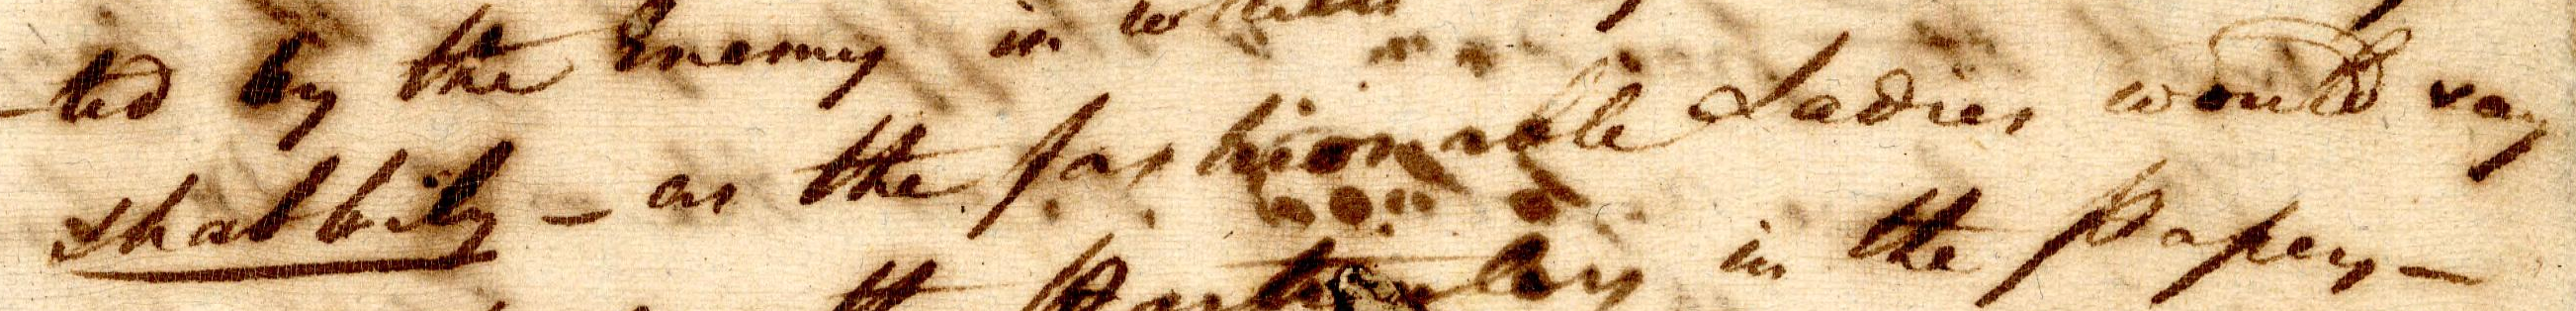shabbily- as the fashionable Ladies would say
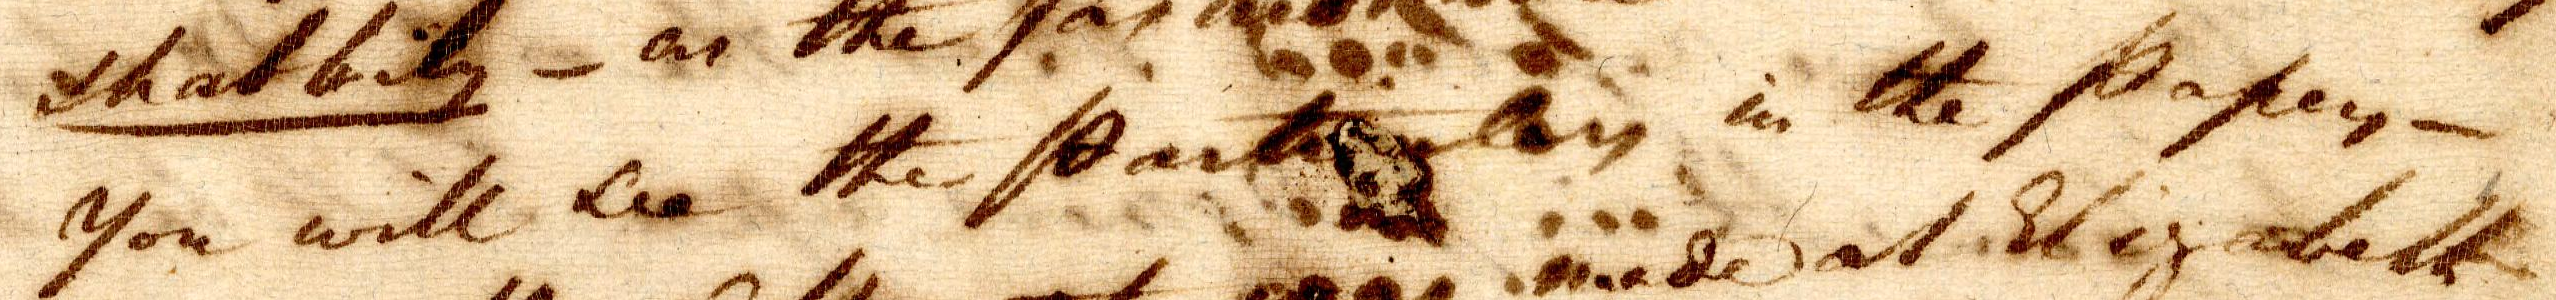you will let the parties lay in the papers-
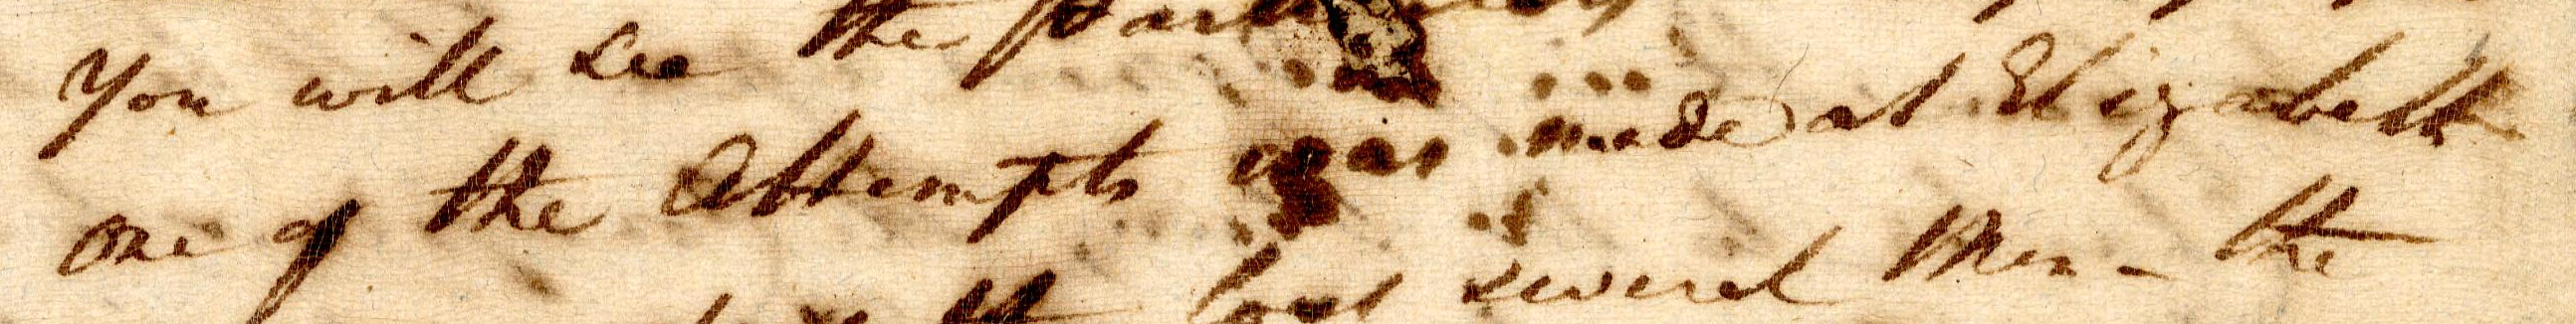one of the Attempts was made at Elizabeth
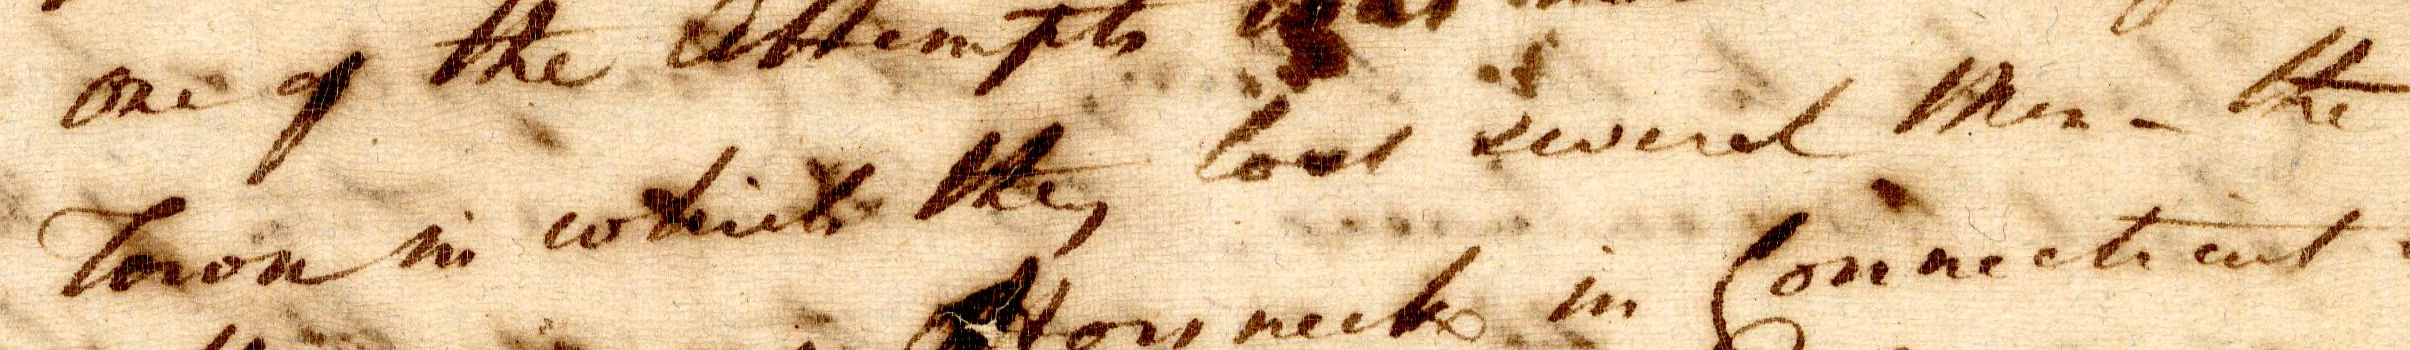Town in which they lost several Men- The
